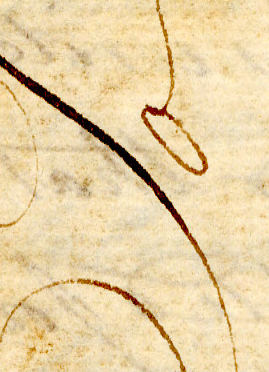To
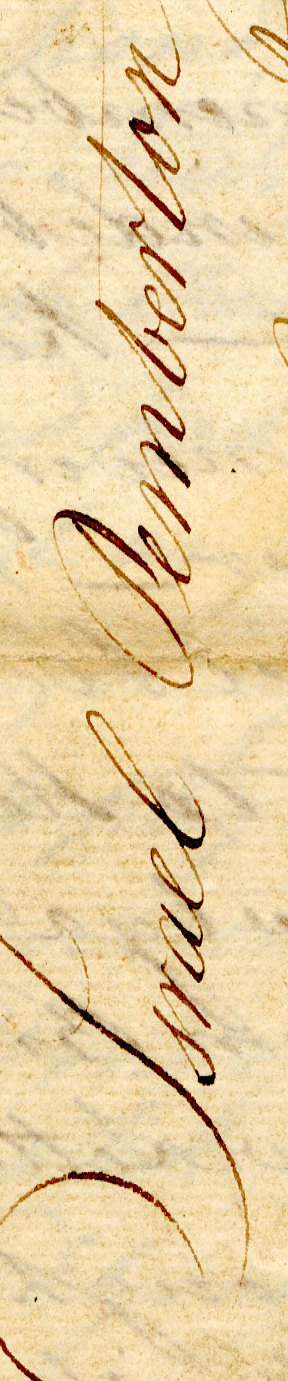Israel Pemberton
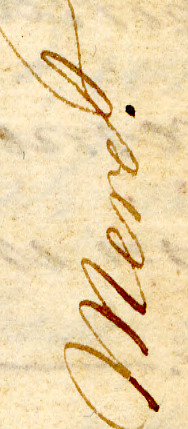Merc^t.
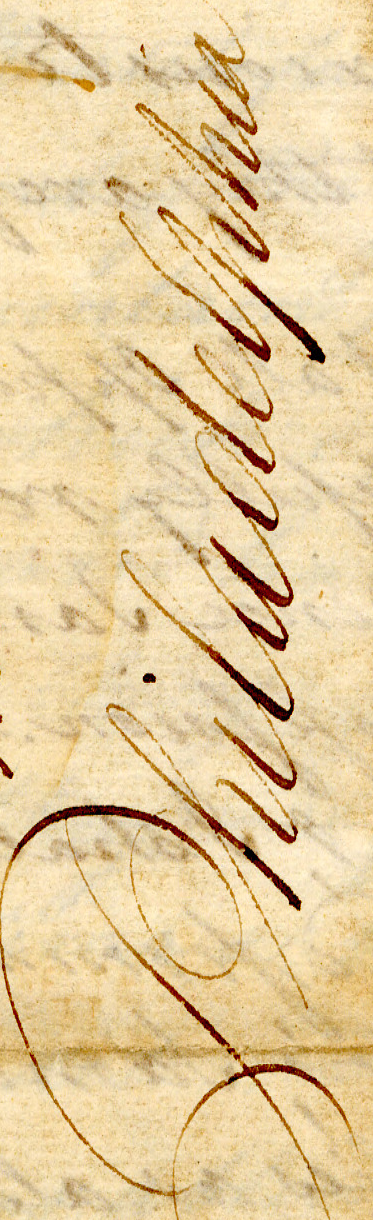Philadelphia
